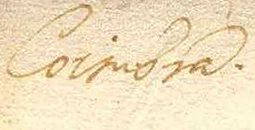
Coimbra.
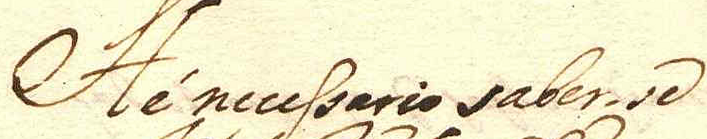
Hé necessario saber se
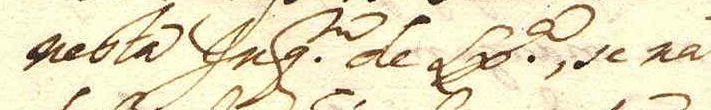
nesta Jnq.m de Lx.a, se na
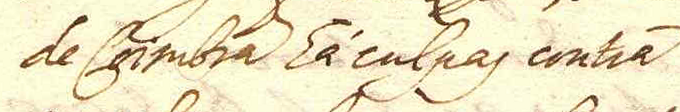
de Coimbra há culpas contra
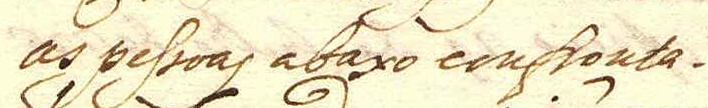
as pessoas abaxo confronta
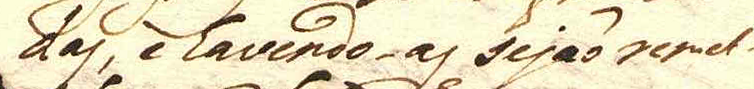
das, e havendo-as sejaõ remet
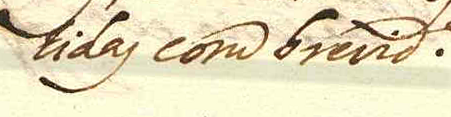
tidas com brevid.e
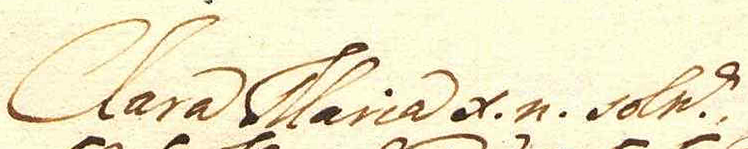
Clara Maria x. n. soltr.a
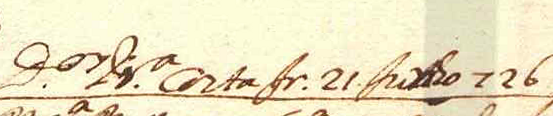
D.os Pr.a costa Jr. 21 Julho 726
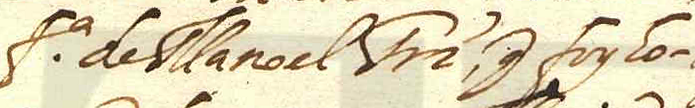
f.a de Manoel Frz̄, q̄ foy ho
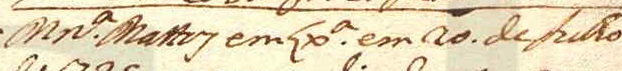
Mn.a Mattos em Lxa em 20. de Julho
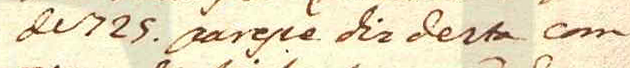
de 725. paresse diz desta com
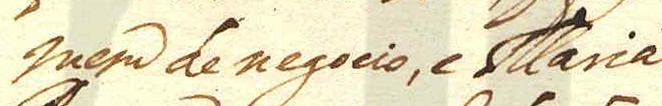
mem de negocio, e Maria
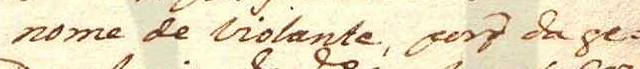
nome de Violante, porq̄ da ge
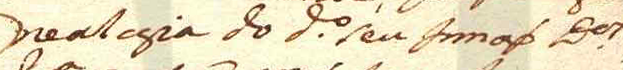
nealogia do d.o seu Jrmaõ D.os
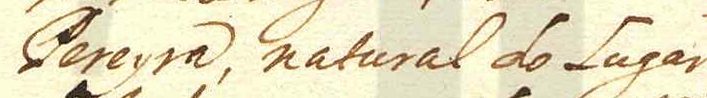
Pereyra, natural do Lugar
